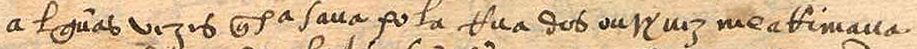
algūas vezes q̄ pasaua pola Rua dos ouryuez me aRimaua
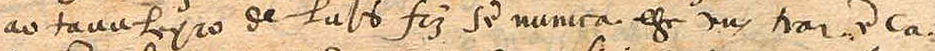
ao tauuleyro de LuIs frz̄ sē numca lhe emtrar ē ca
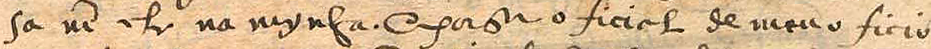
sa nē ele na mynha. e por ser oficiaL de meu oficio
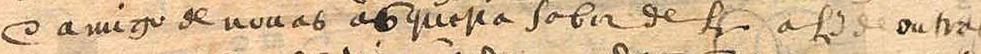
e amigo de nouas as queria saber dele alē de outras
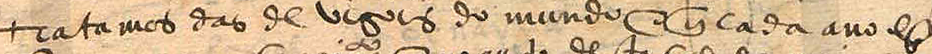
tratamos das devisoĩs do mundo e q̄ cada ano hy
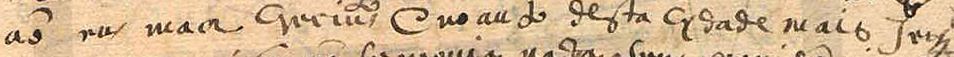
aõ em maor Crecimto e no auto desta cydade mais Jntr̄
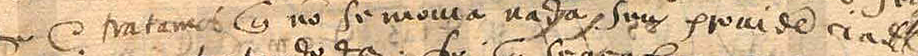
te e tratamos q̄ nō se mouia nada sem prouidēcia de
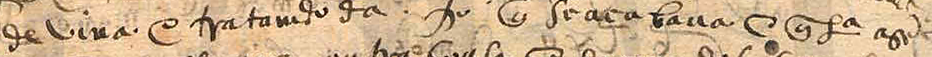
devina e tratamdo da .fe q̄ se acabaua e q̄ ꝑa asē
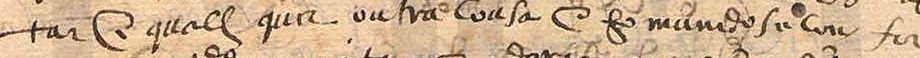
tar ē quall quer outra Cousa e ho mumdo se comfir
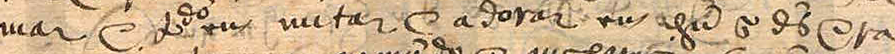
mar e todo emmitar e adorar em hū so ds̄ era
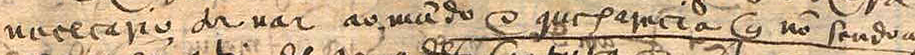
nececario tornar ao mūdo e que parecia q̄ nō sendo a
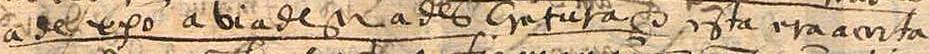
a de xpō avia de ser a desCretura e esta era a certa
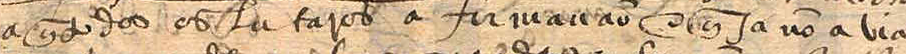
a q̄ todos os Luteros afirmauaõ e q̄ ja nō avia
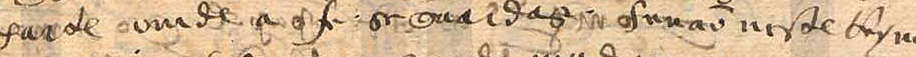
parte omde a fe. se guardase senaõ neste Reyno
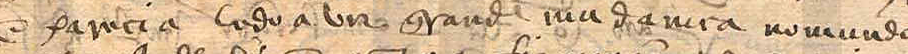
e parecia Cedo aver grande mudamca no mundo
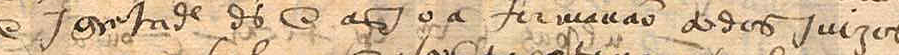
e JgreJa de ds e asJ o afirmauaõ todos Juizos
